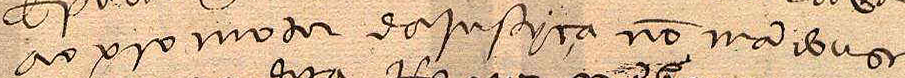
ao promotor da Justyça nō mādou se
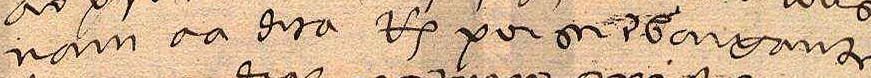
nam aa dita Rꝭ por ser ēbargante
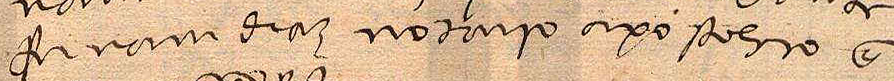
fernam diaz notairo apostolyco q̄
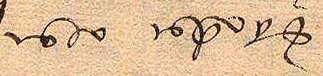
esto esp̄vy
